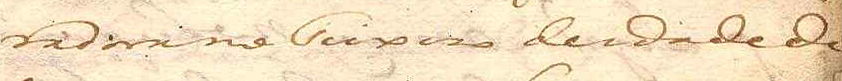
radora no Teixozo de idade de
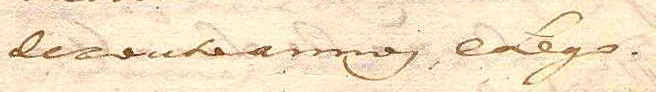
dezouto annos, e Logo.
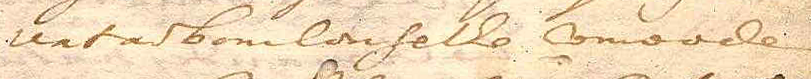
va taõ bom Conselho, como o de
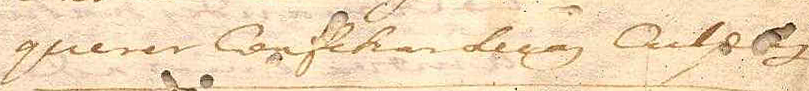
querer Confesar suas Culp_s
